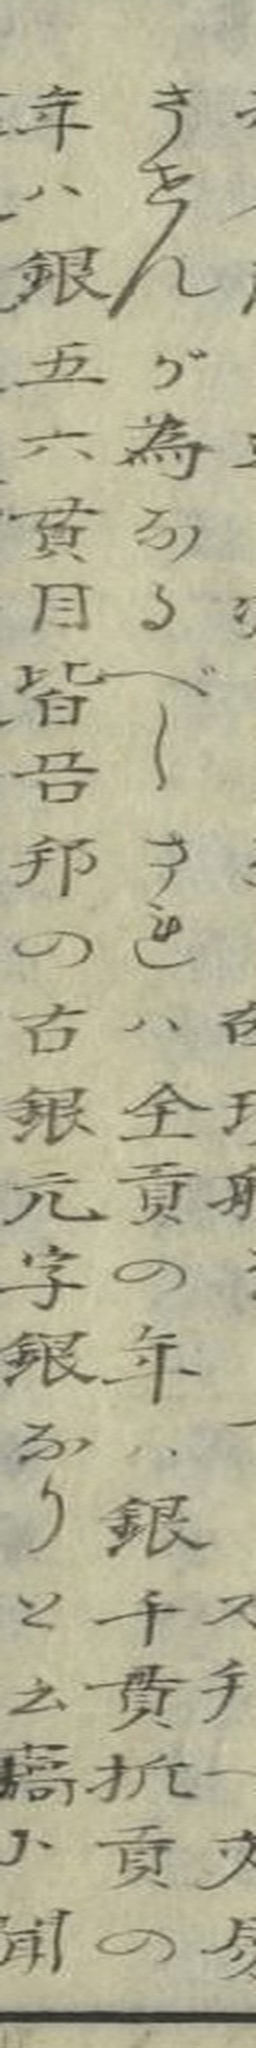年は銀五六貫目皆吾邦の古銀元字銀なりと云竊に聞
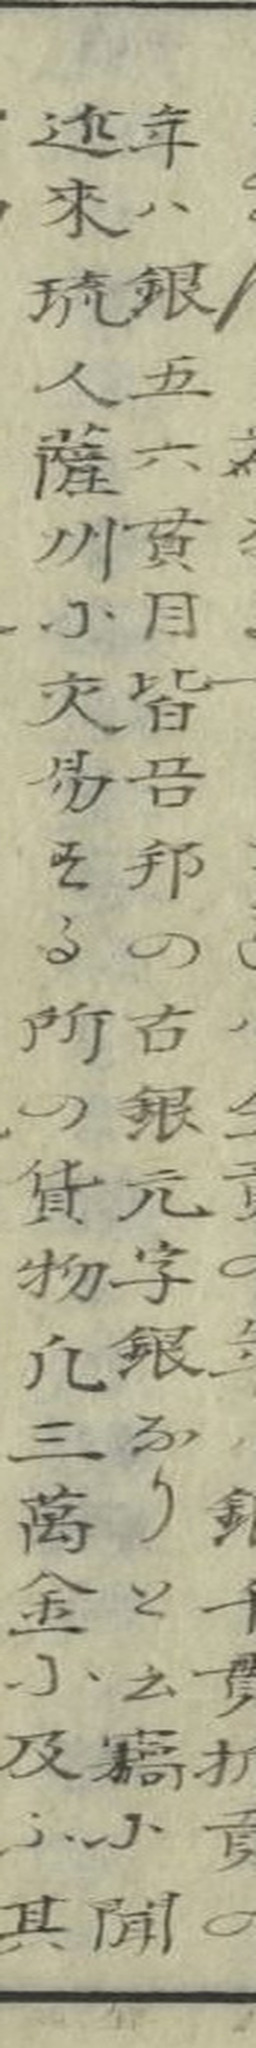近来琉人薩州に交易する所の貨物凡三万金に及ふ其
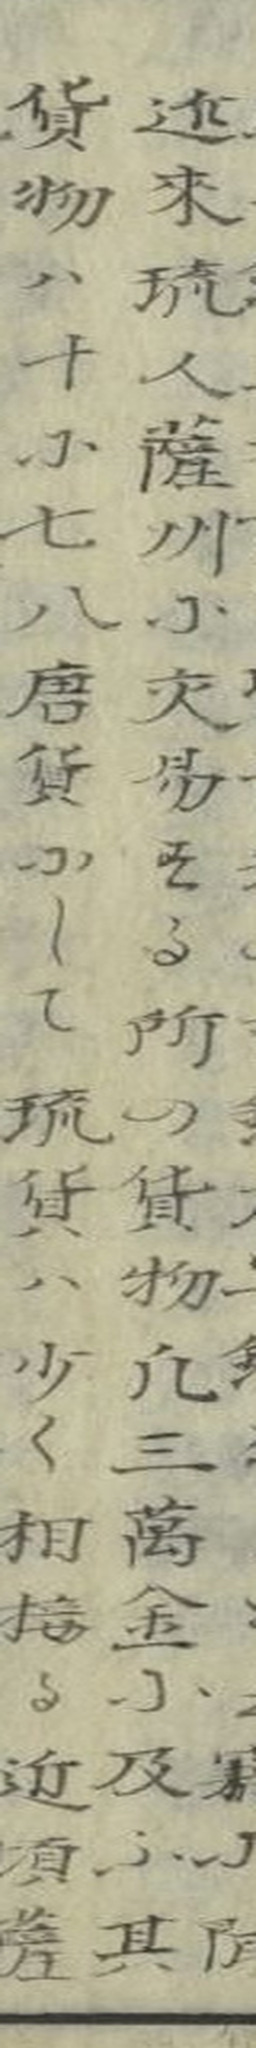貨物は十に七八唐貨にして琉貨は少く相接る近頃薩
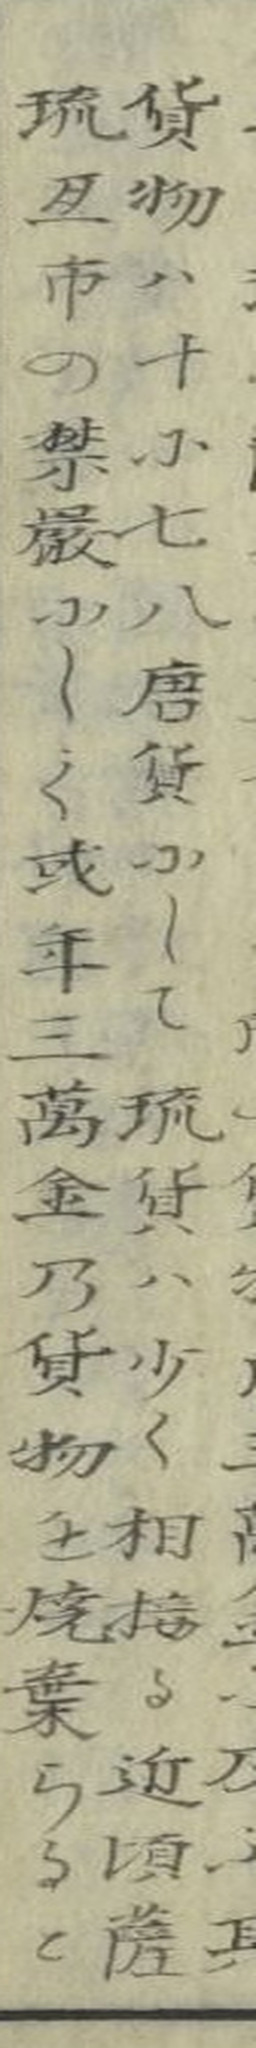琉互市の禁厳にして或年三万金の貨物を焼棄らると

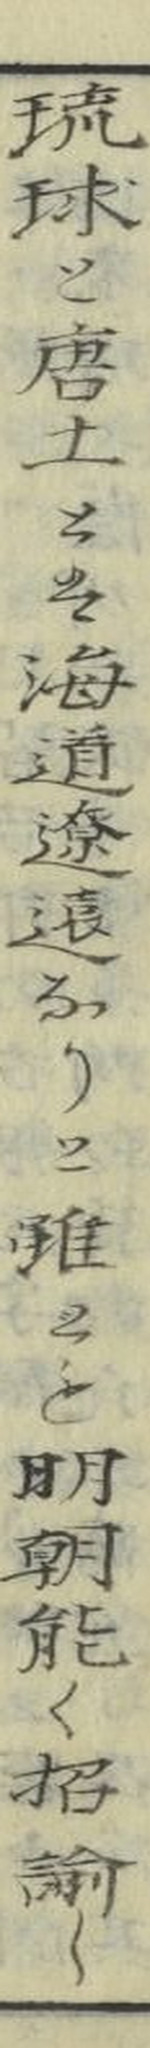琉球と唐土とは海道遼遠なりと雖とも明朝能く招諭し
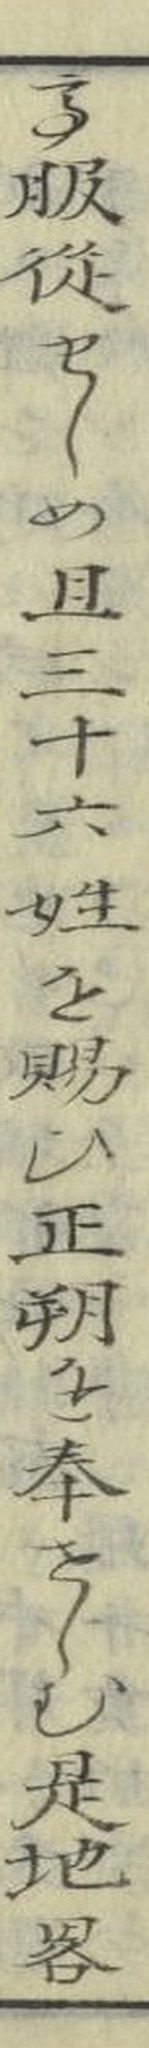て服従せしめ且三十六姓を賜ひ正朔を奉せしむ是地略
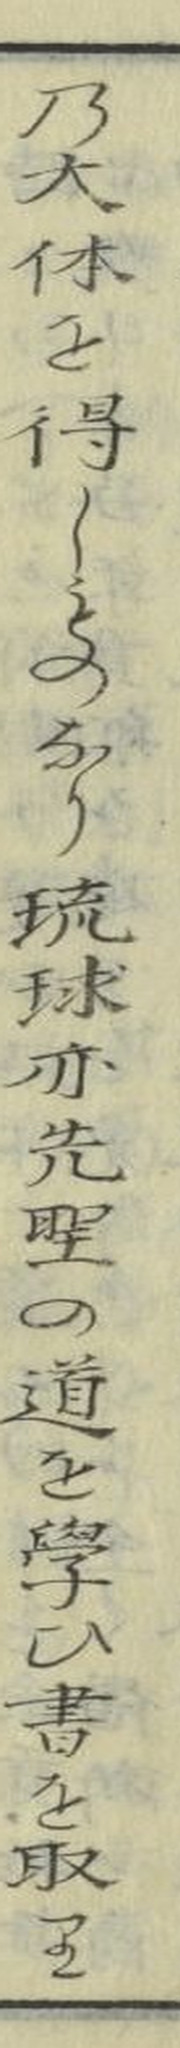の大体を得しものなり琉球亦先聖の道を学ひ書を取り
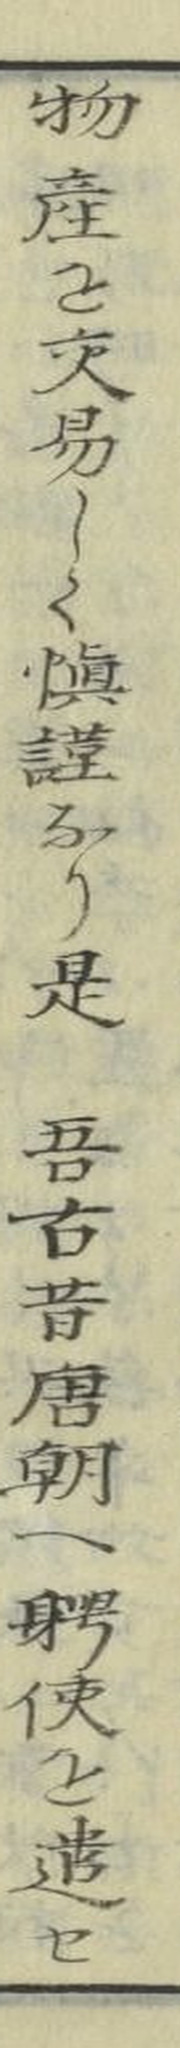物産を交易して慎謹なり是吾古昔唐朝へ聘使を遣せ
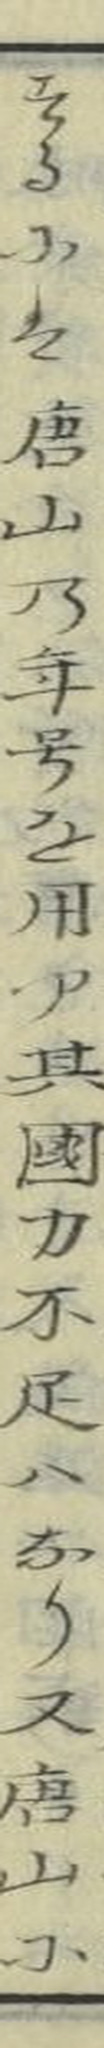するには唐山の年号を用ゆ其国力不足はなり又唐山に
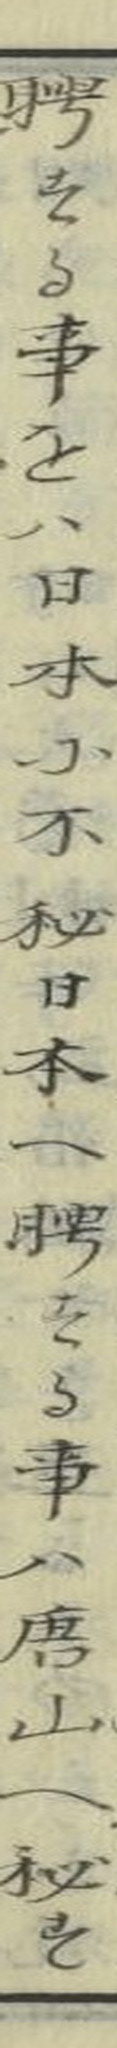聘する事をは日本に不秘日本へ聘する事は唐山へ秘す
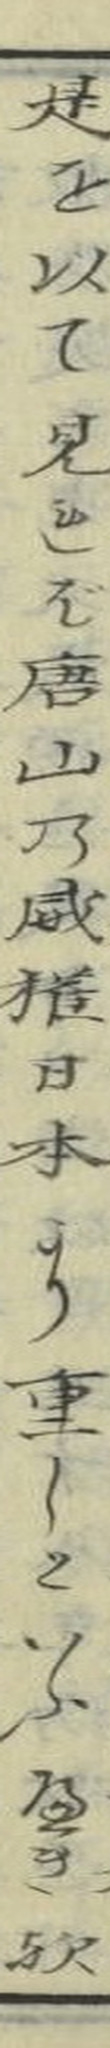是を以て見れば唐山の威権日本より重しといふへき欤
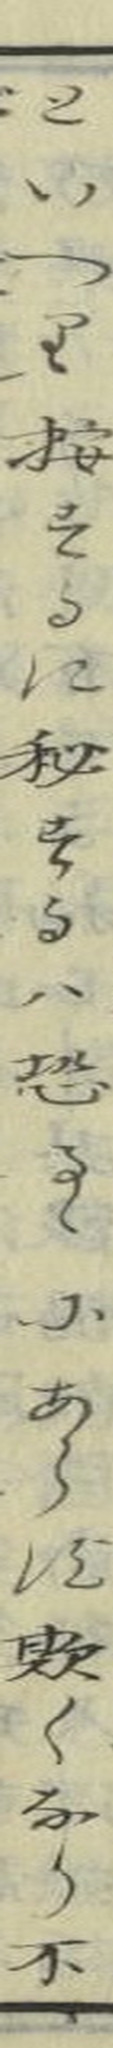といへり按するに秘するは恐るヽにあらず斯くなり不
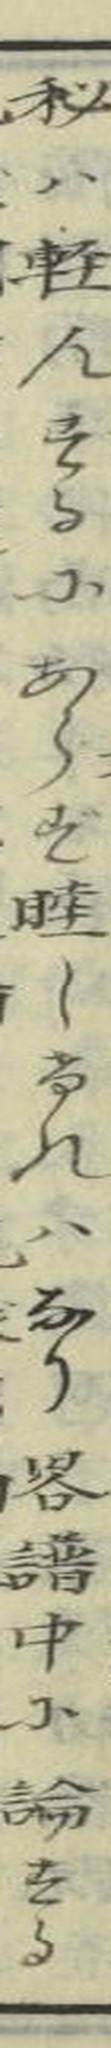秘は軽んするにあらず睦しけれはなり略譜中に論する
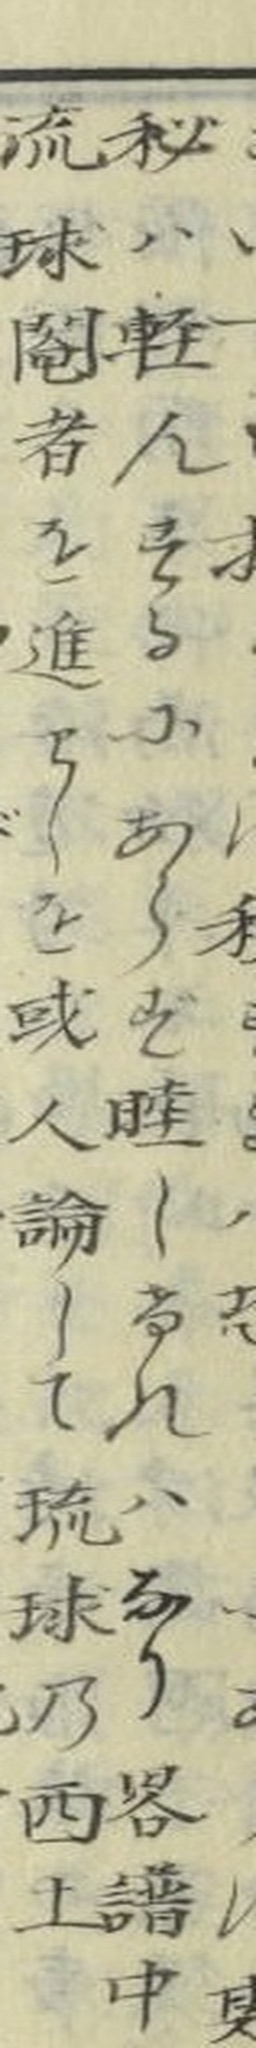琉球閹者を進せしを或人論して琉球の西上
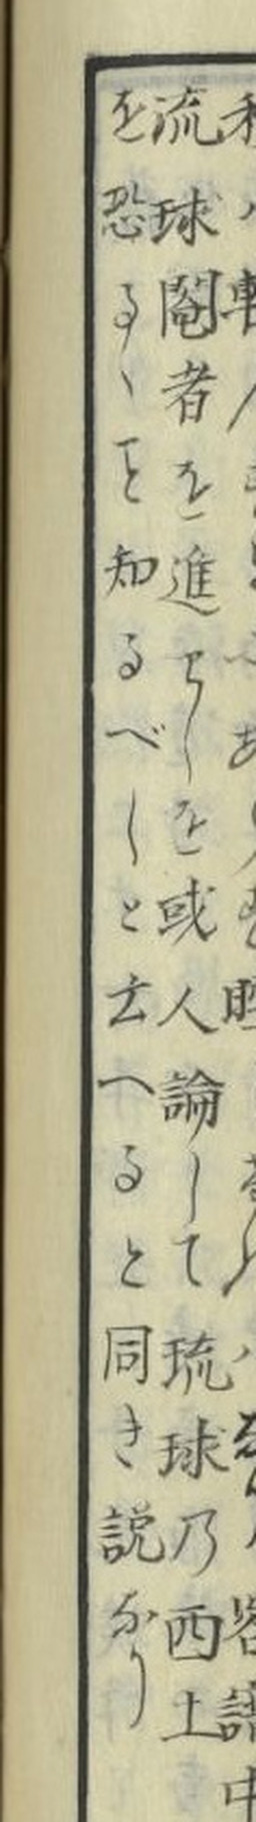を恐るヽこと知るべしと云へると同き説なり
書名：琉球沿革志 下
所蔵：University of the Ryukyus Library
